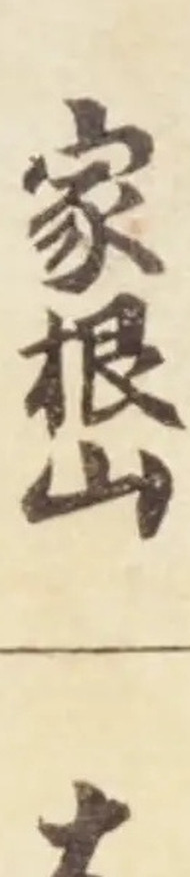家根山
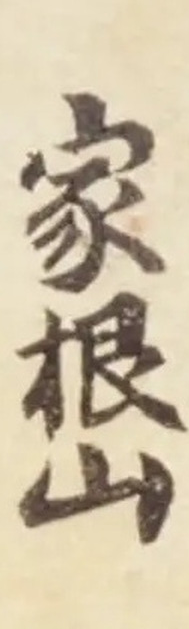家根山
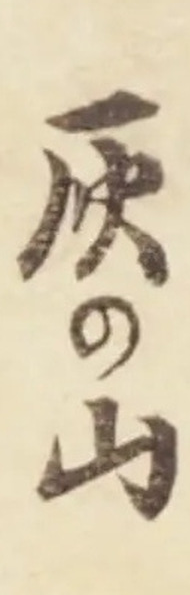灰の山
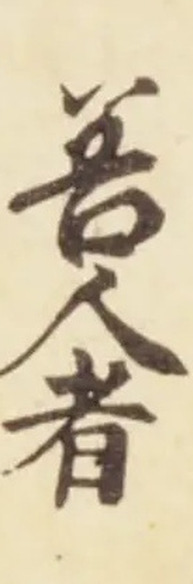善人者
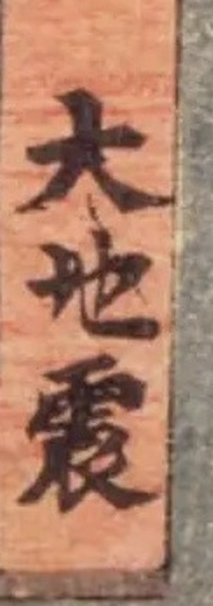大地震
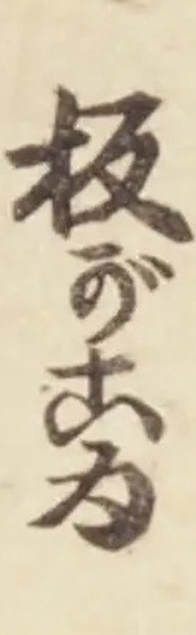板がこゐ
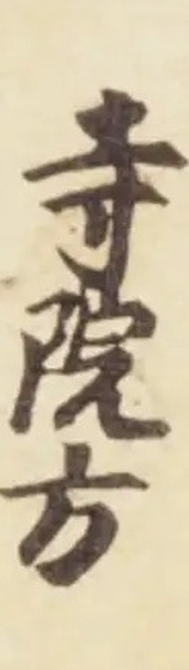寺院方
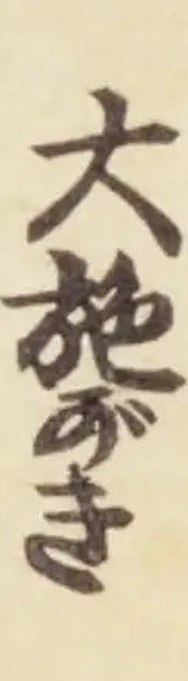大施がき
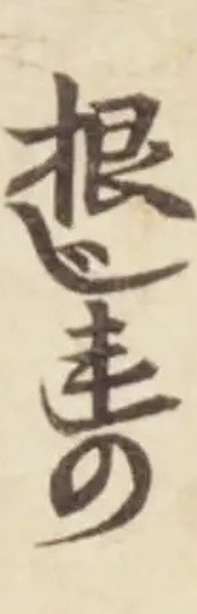根じれの
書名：見たて大地震角力取くみ
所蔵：国立国会図書館 National Diet Library, JAPAN
